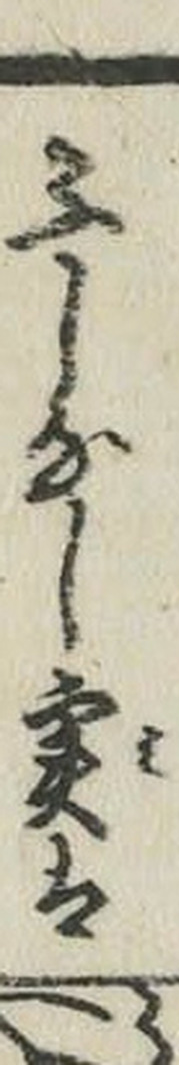ふしなし実は
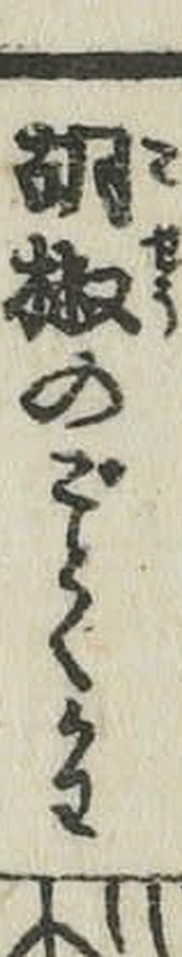胡椒のごとくかわ
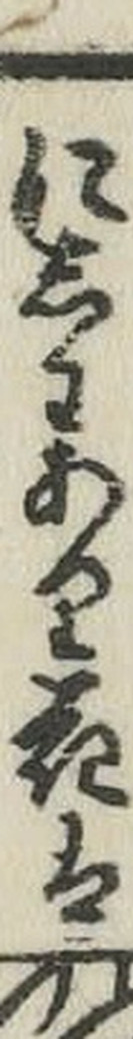にしわあり花は
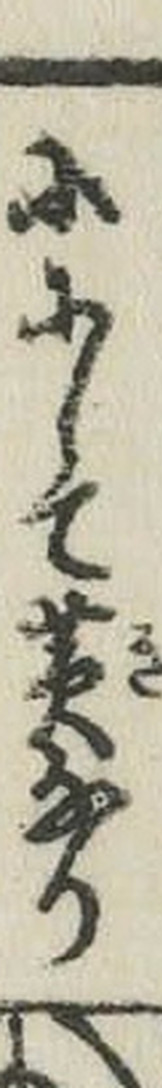小にして黄なり
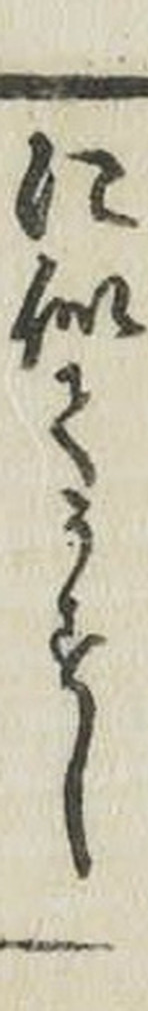に似てうすし
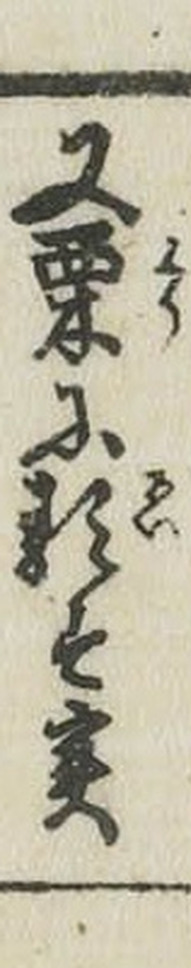又栗に類す実
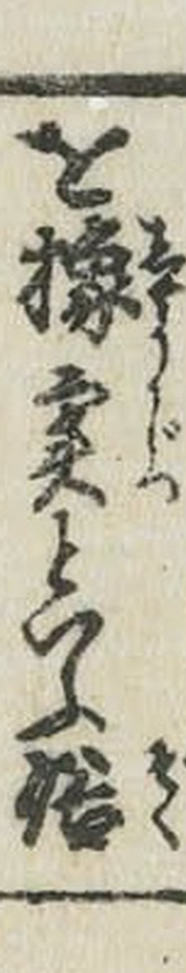を橡実といふ俗
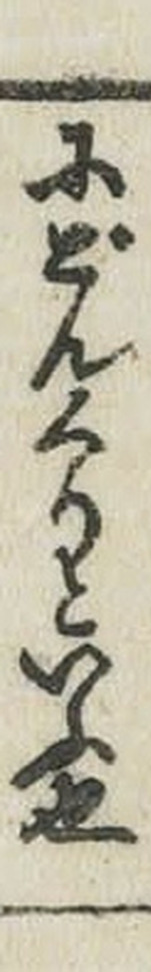にどんくりといふ也
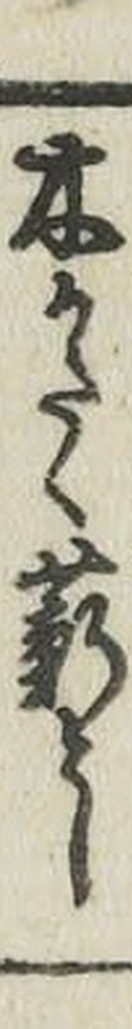木かたく薪とし
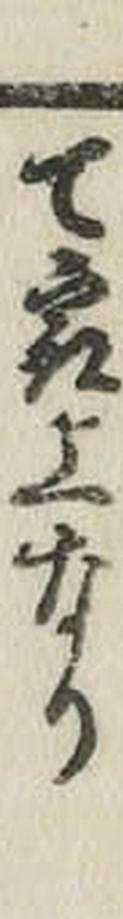て最上なり
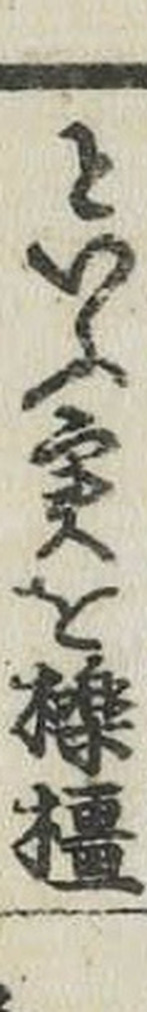といふ実を櫟橿
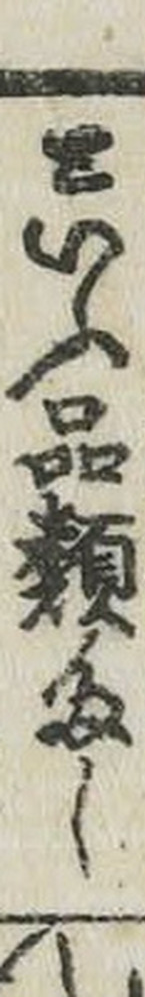といふ品類多し
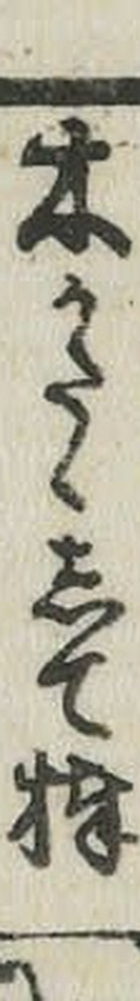木かたくして棒
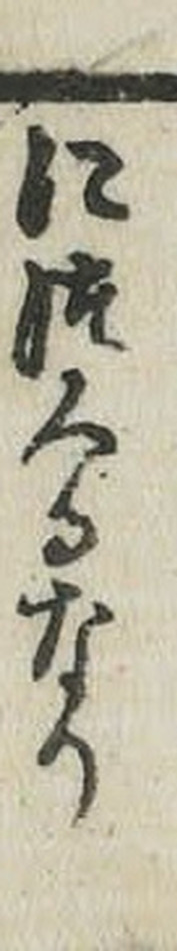につくるなり

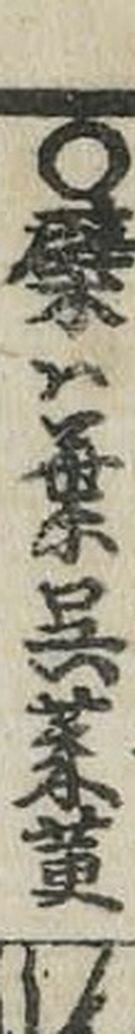○檗は葉呉茱萸
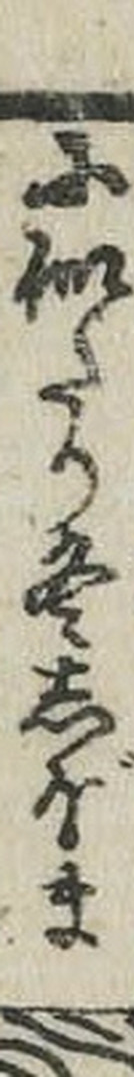に似たり冬しぼま
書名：増補頭書訓蒙図彙大成 10巻 8:巻之17-19
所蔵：東京学芸大学教育コンテンツアーカイブ
